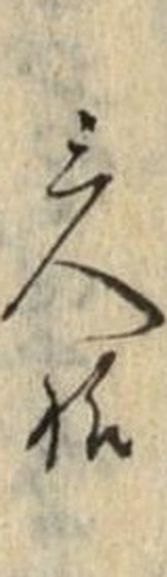三人様
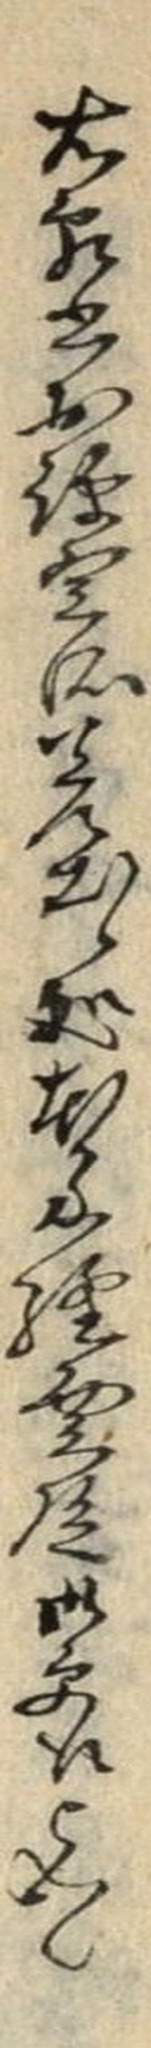右願出於評定所差出候処本多縫殿御受取被成候
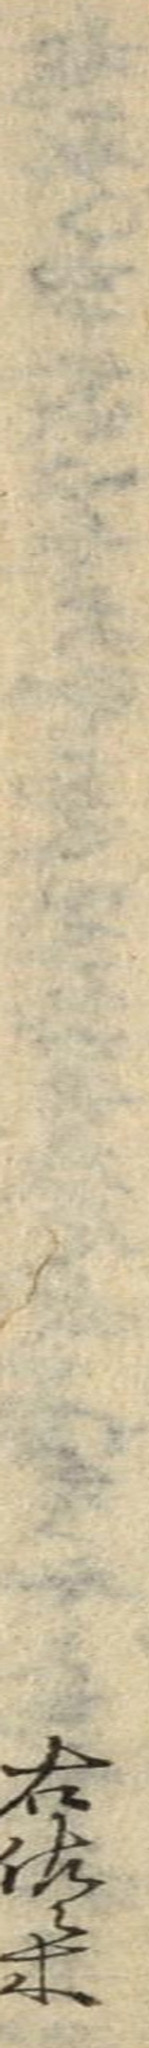右佐々木
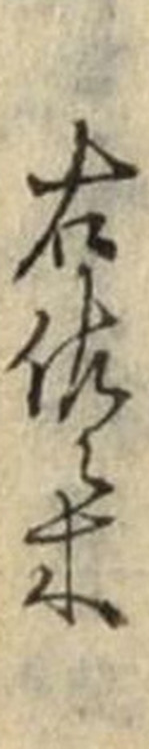右佐々木
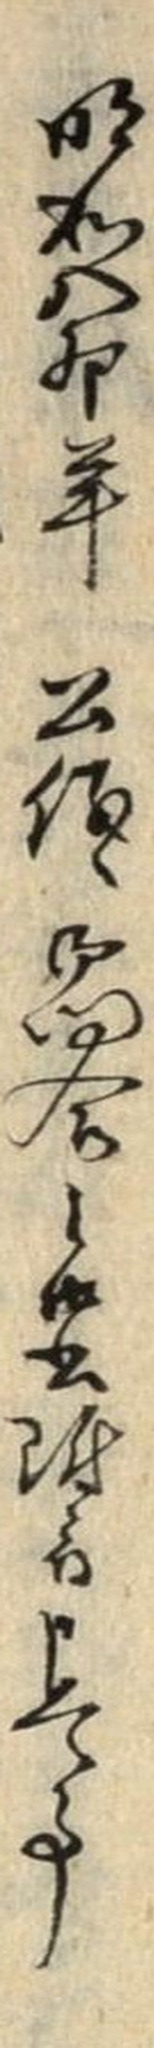明和八卯年公儀へ御問合之御書附ニ付申上候事
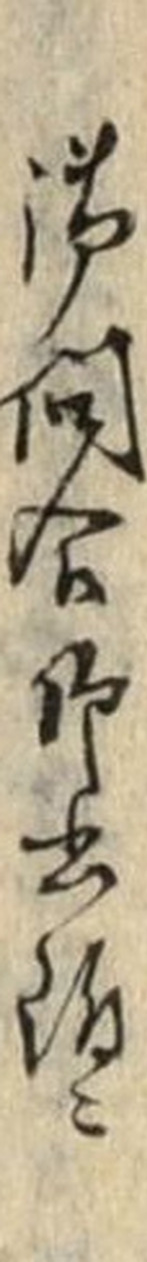御問合御書附ニ
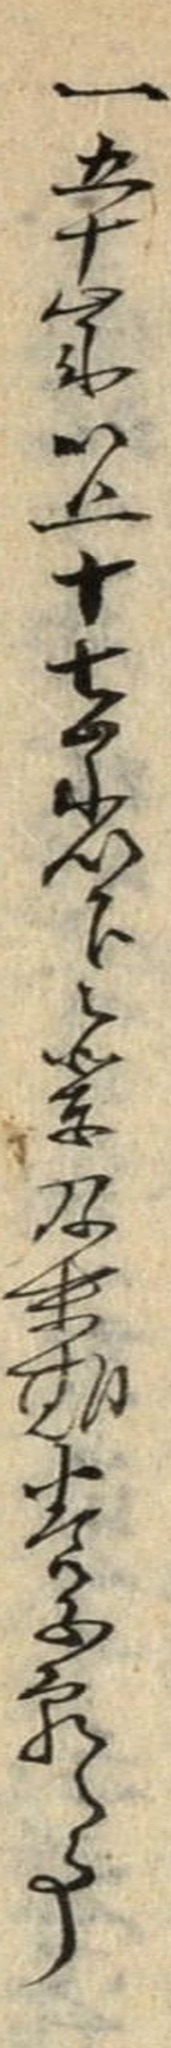一五十歳以上十七歳以下之輩及末期養子願之事
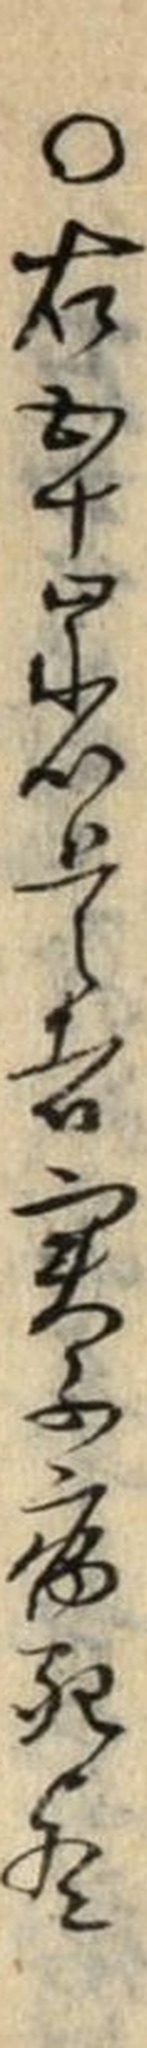〇右五十歳以上之者実子病死歟

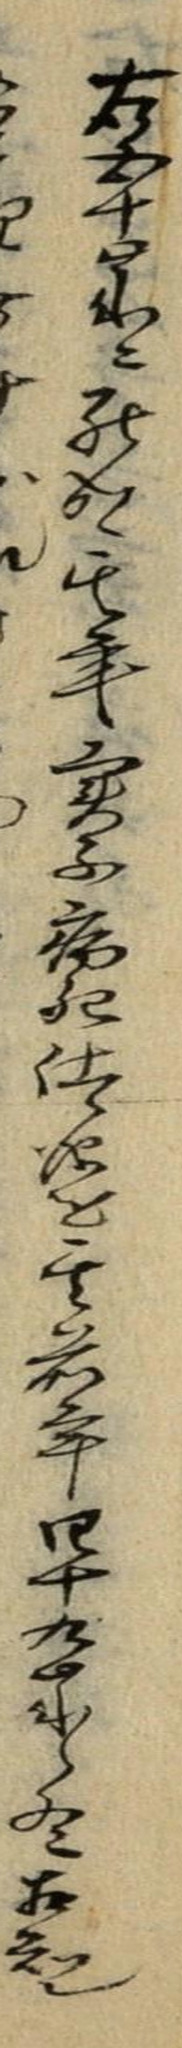右五十歳ニ罷成候其年実子病死仕候儀を其前年四十九歳之冬相知レ
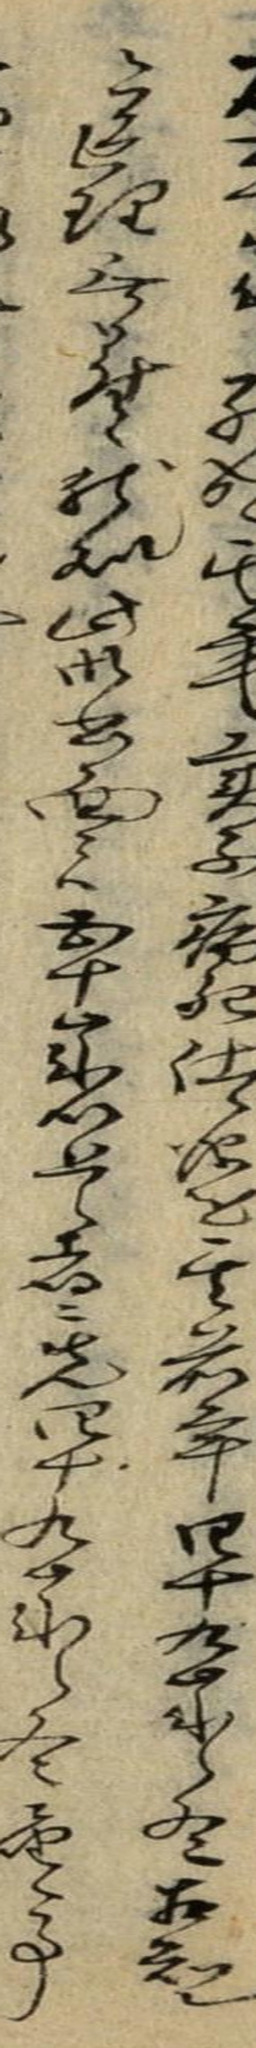候道理無御座候然処此御書面ニハ五十歳以上之者ニ先四十九歳之冬届候事
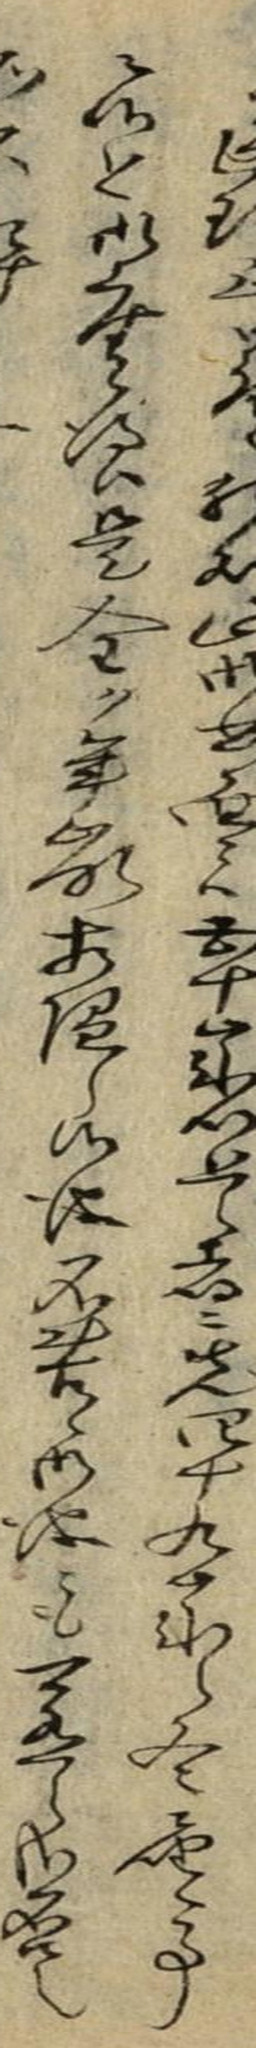ニ候と御座候得ハ是全ク年齢相隠し候儀不苦候御儀ニも可有候哉否之
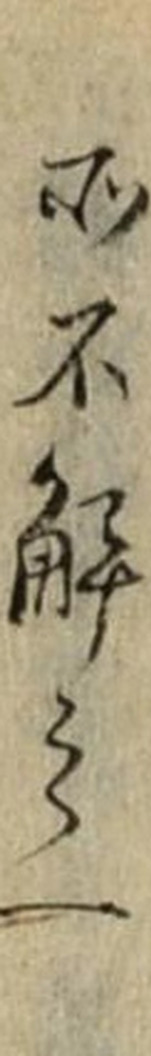所不解之一
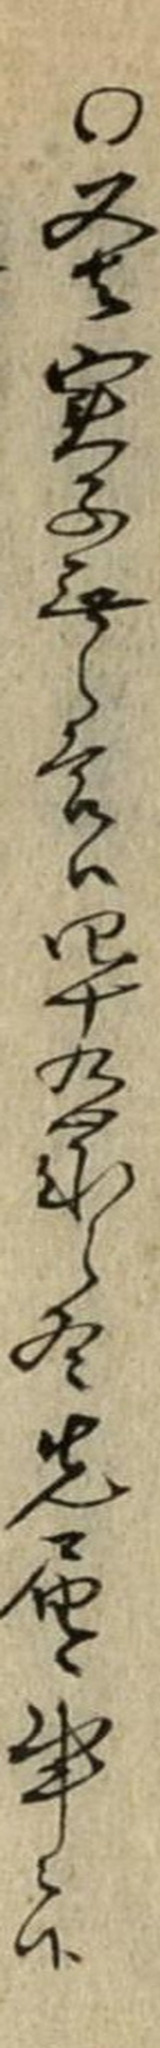〇又者実子無候節ハ四十九歳之冬先届候事ニ候
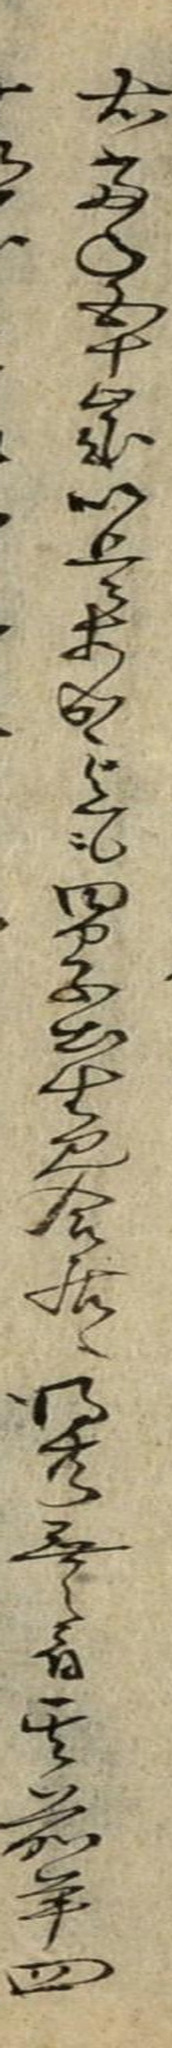右当年五十歳以上ニ相成候迄も男子出生見合居候得共無之ニ付其前年四
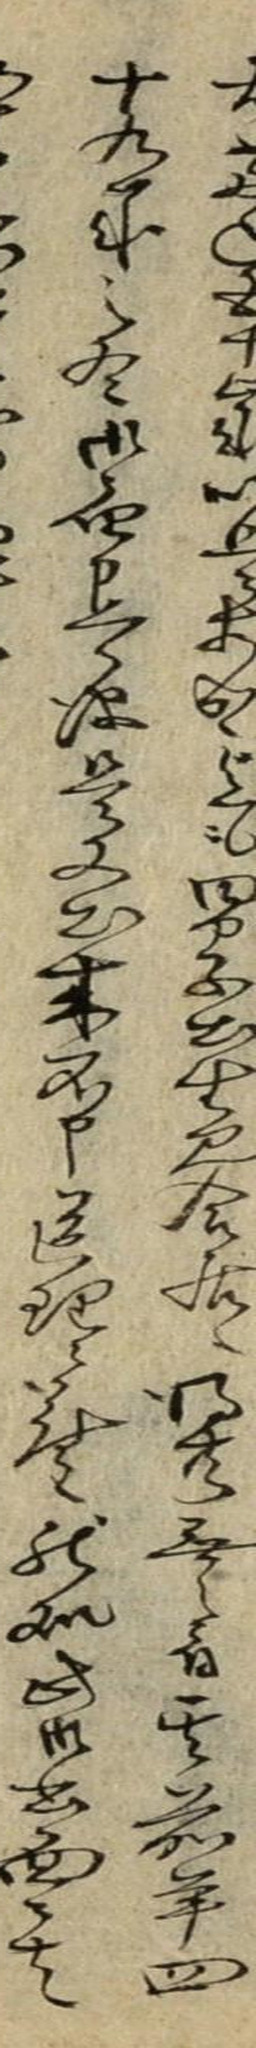十九歳之冬御届申上候儀且又出来不申道理御座候然処此書面ニ者
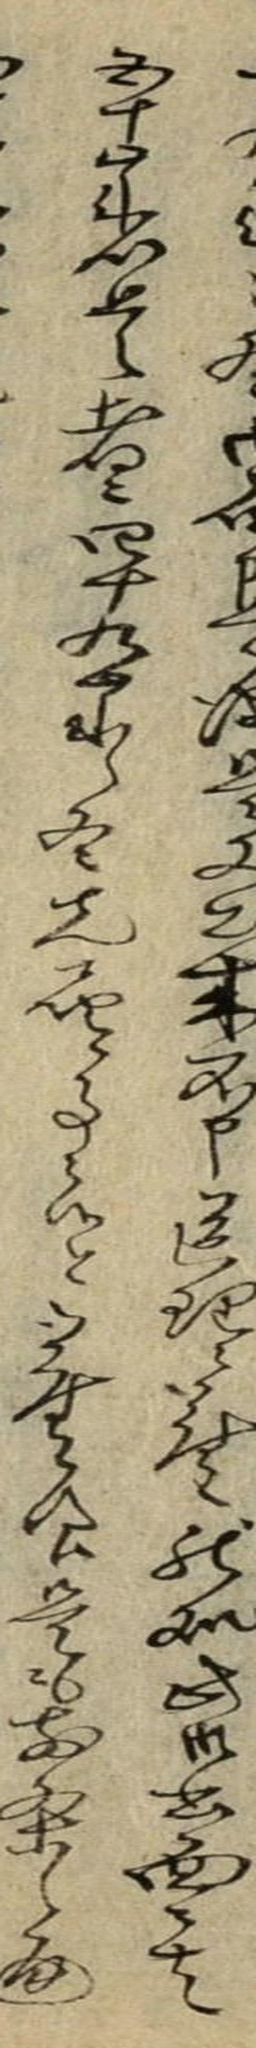五十歳以上之者ニ四十九歳之冬先届候事ニ候と御座候得ハ是も前条之通
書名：養子縁組之部
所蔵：福井県文書館 Fukui Prefectural Archives
